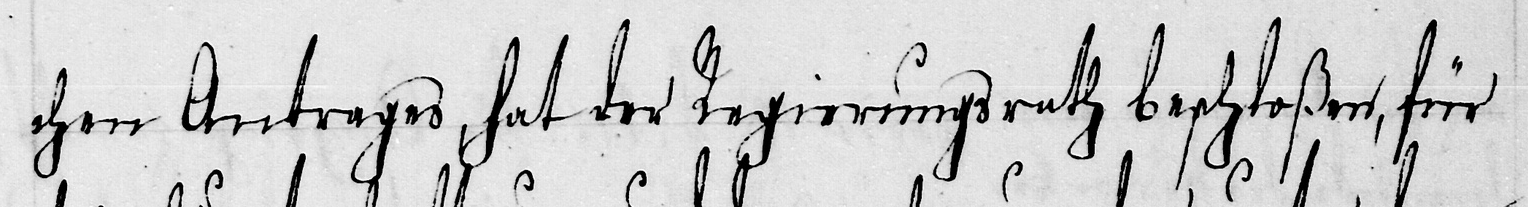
chen Antrages, hat der Regierungsrath beschloßen, für
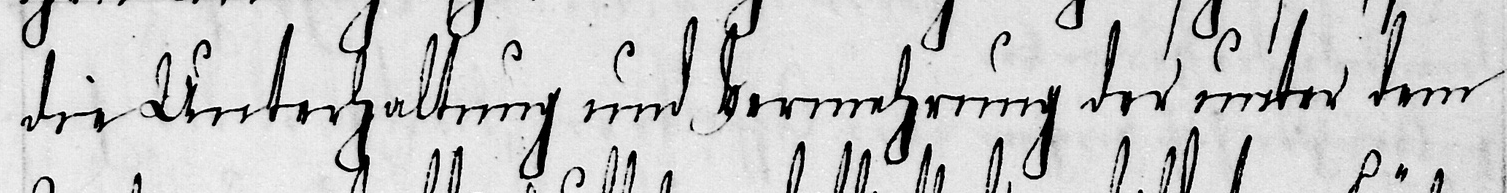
die Unterhaltung und Vermehrung der unter dem
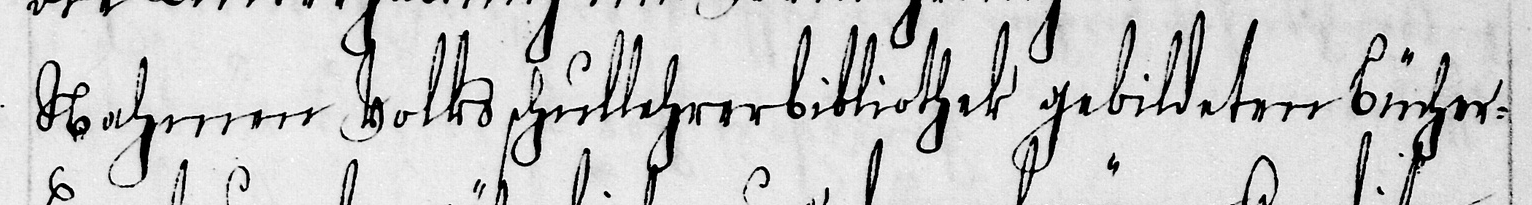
Nahmen Volksschullehrerbibliothek gebildeten Bücher¬
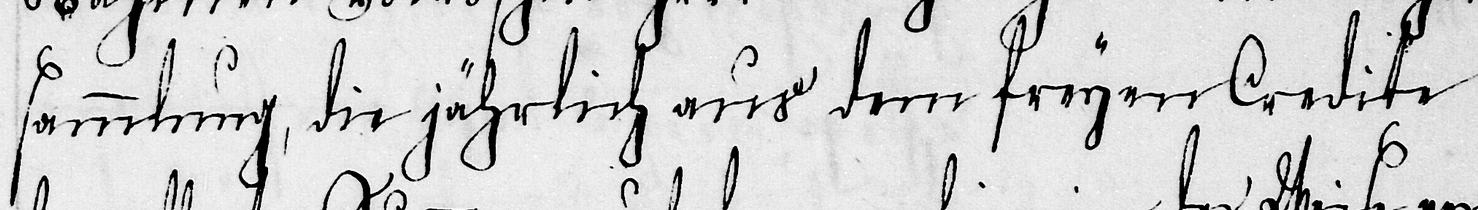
sammlung, die jährlich aus dem freyen Credite
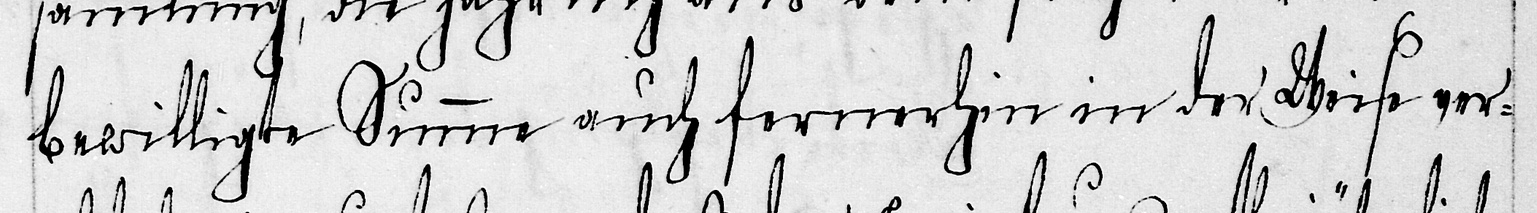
bewilligte Summe auch fernerhin in der Weise ver¬
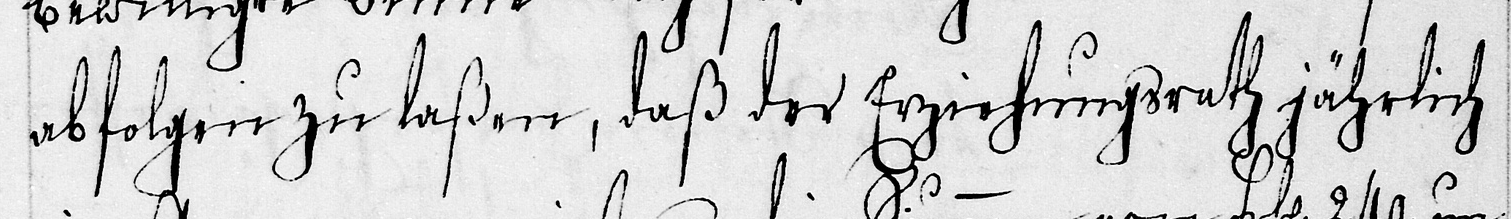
abfolgen zu laßen, daß der Erziehungsrath jährlich
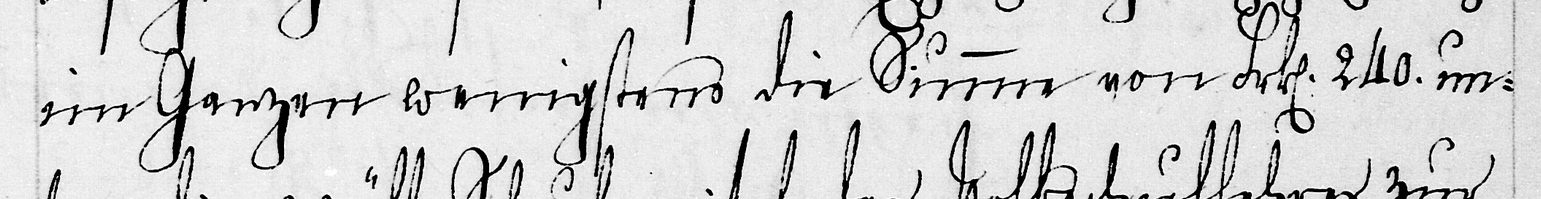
im Ganzen wenigstens die Summe von Frk[en]. 240. un¬
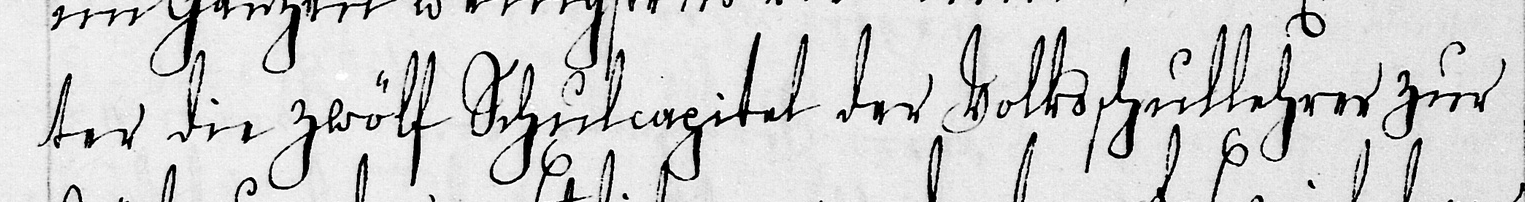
ter die zwölf Schulcapitel der Volksschullehrer zur
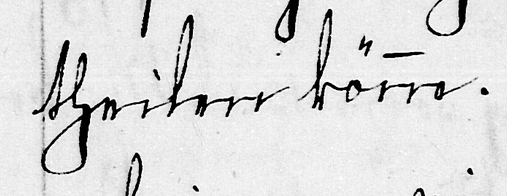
theilen könne.
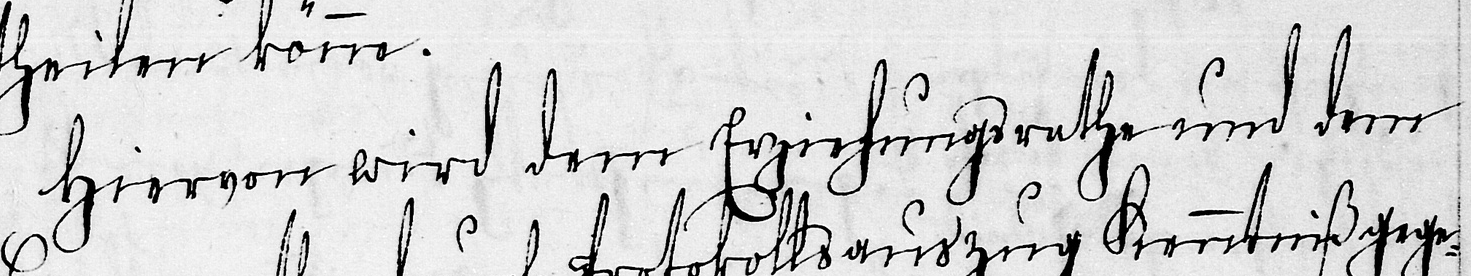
Hiervon wird dem Erziehungsrathe und dem
